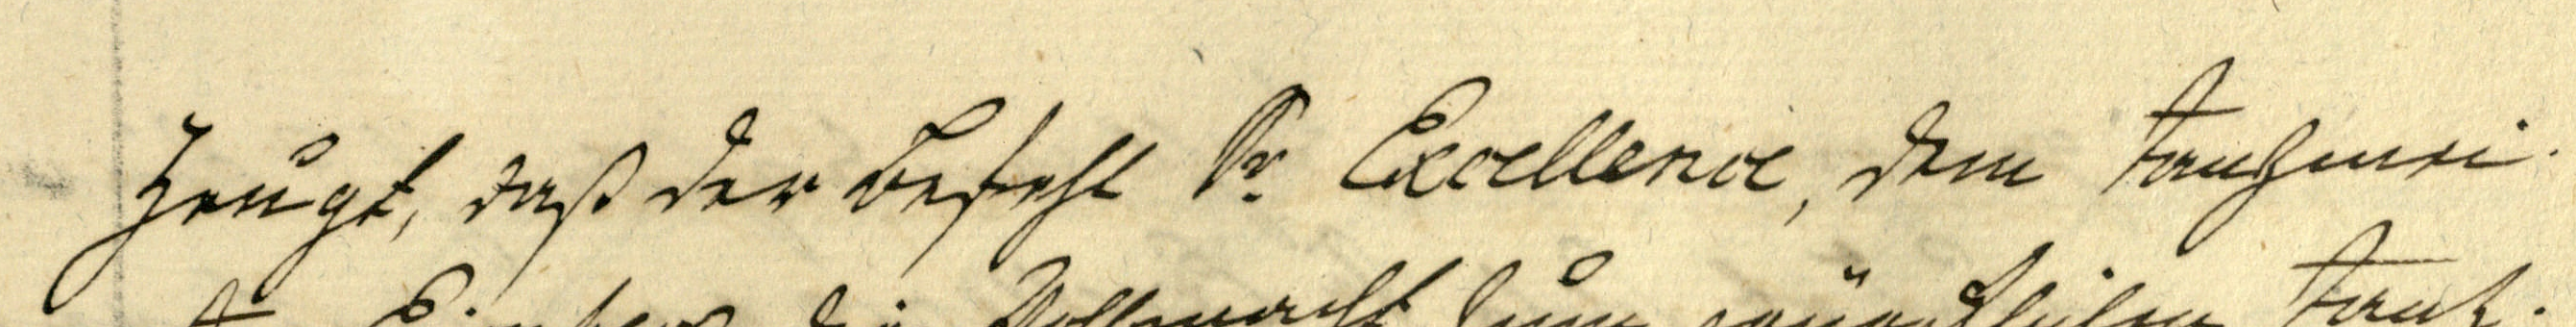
zeugt, daß der Befehl Sr Excellence, dem Tanzmei¬
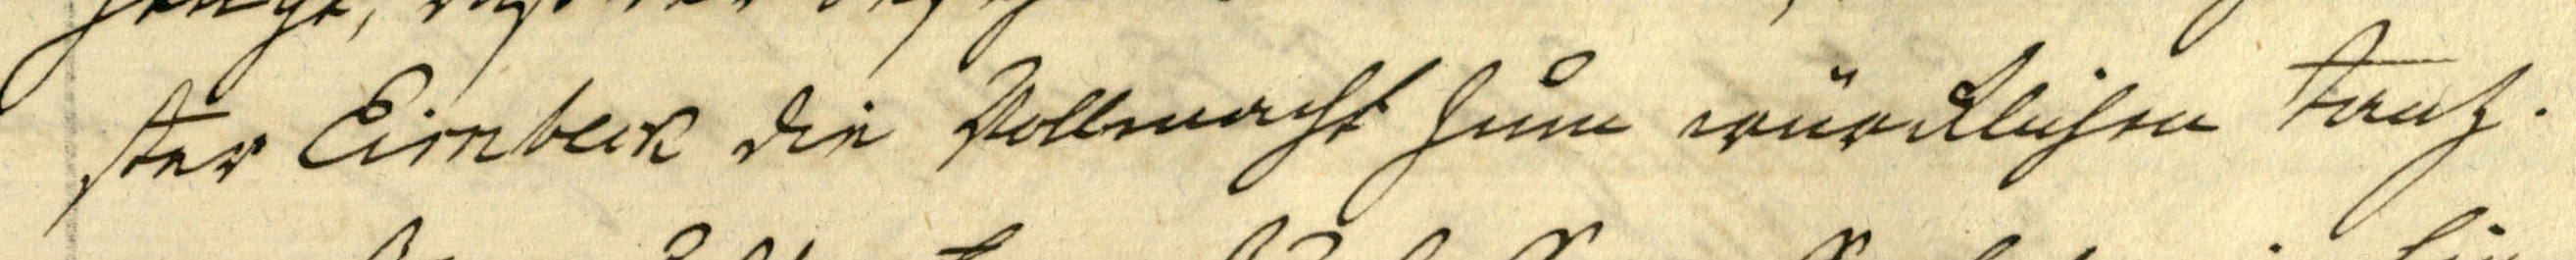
ster Eimbeck die Vollmacht zum würcklichen Tanz¬
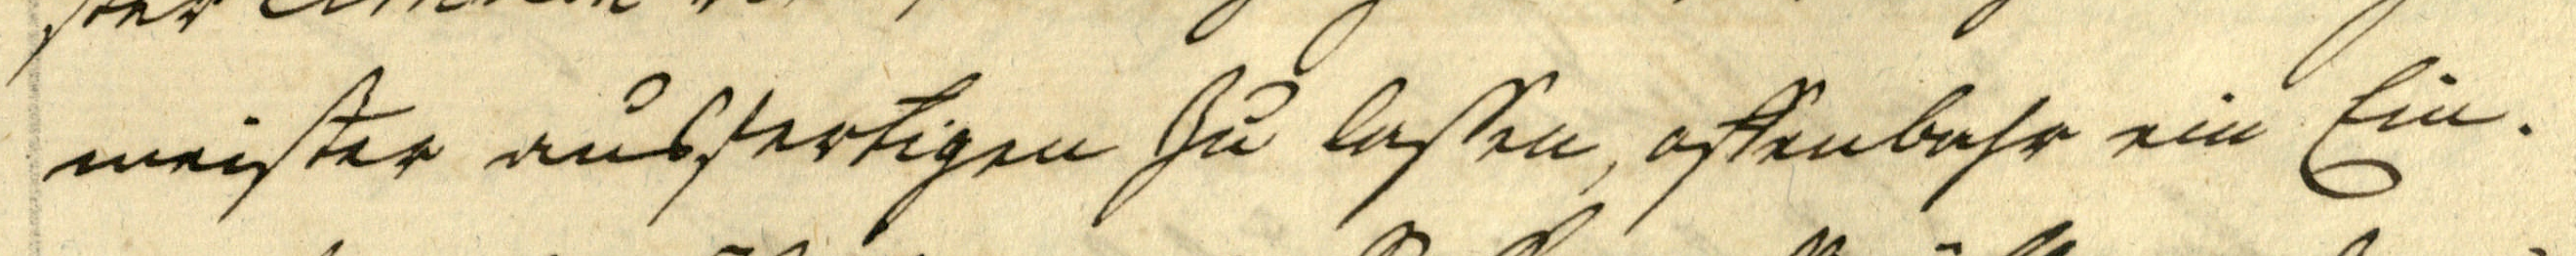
meister ausfertigen zu lassen, offenbahr ein Ein¬
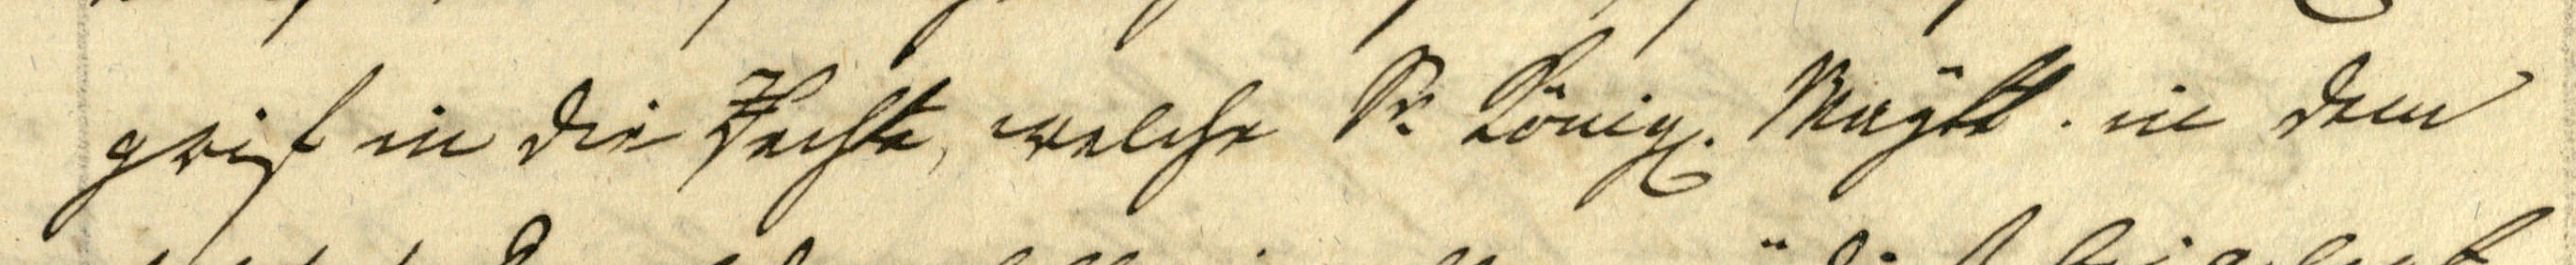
grif in die Rechte, welche Sr Königl. Maytt., in dem
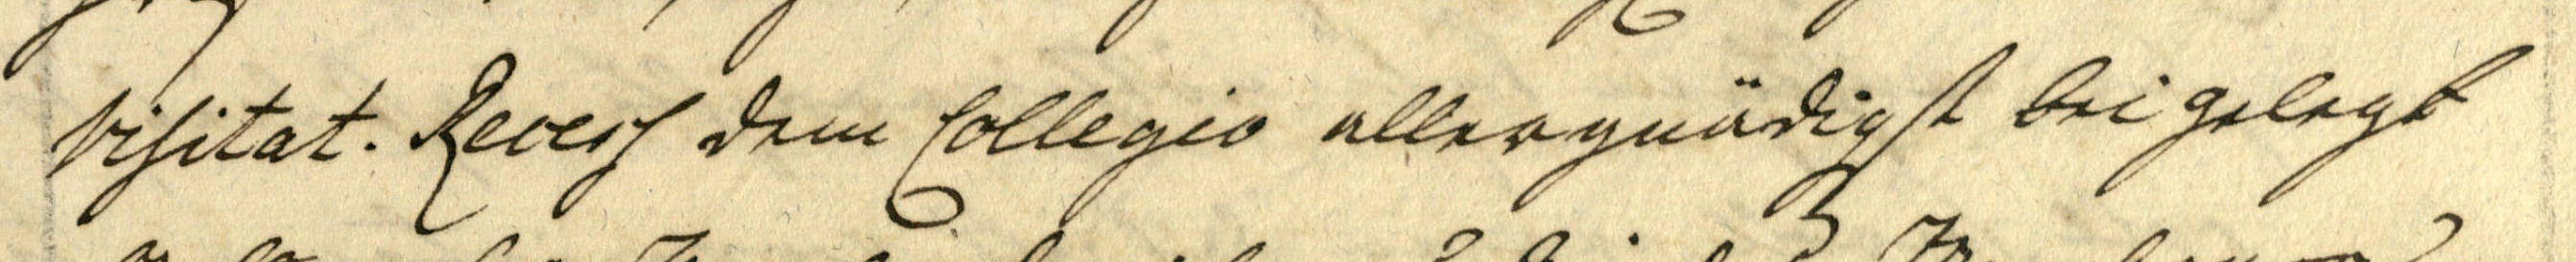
Visitat. Recess dem Collegio allergnädigst bei gelegt
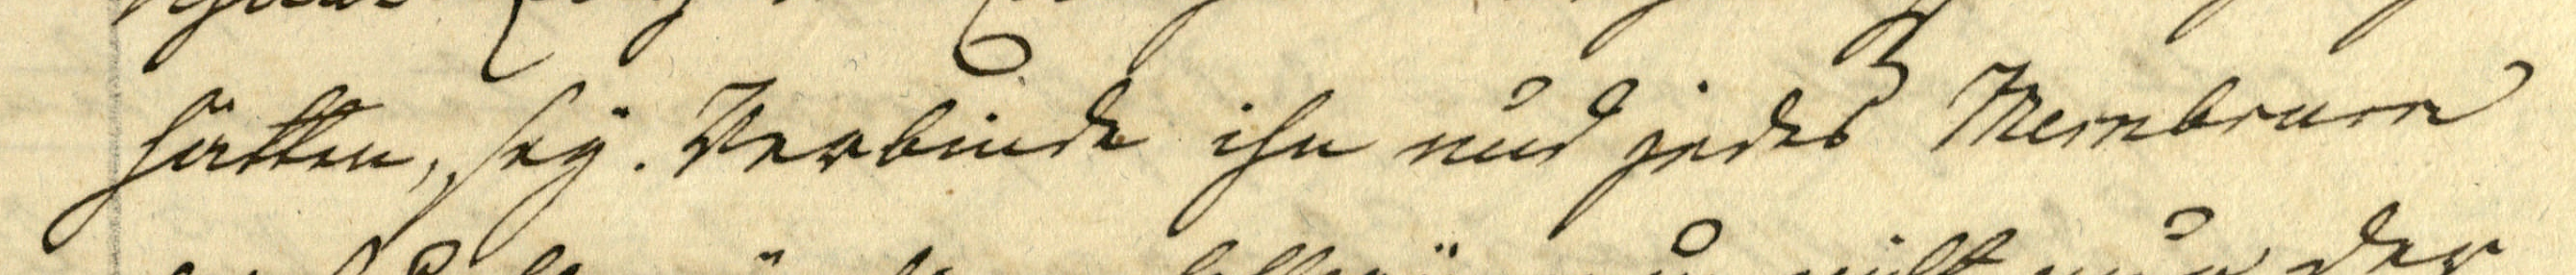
hätten, seÿ. Verbinde ihn und jedes Membrum
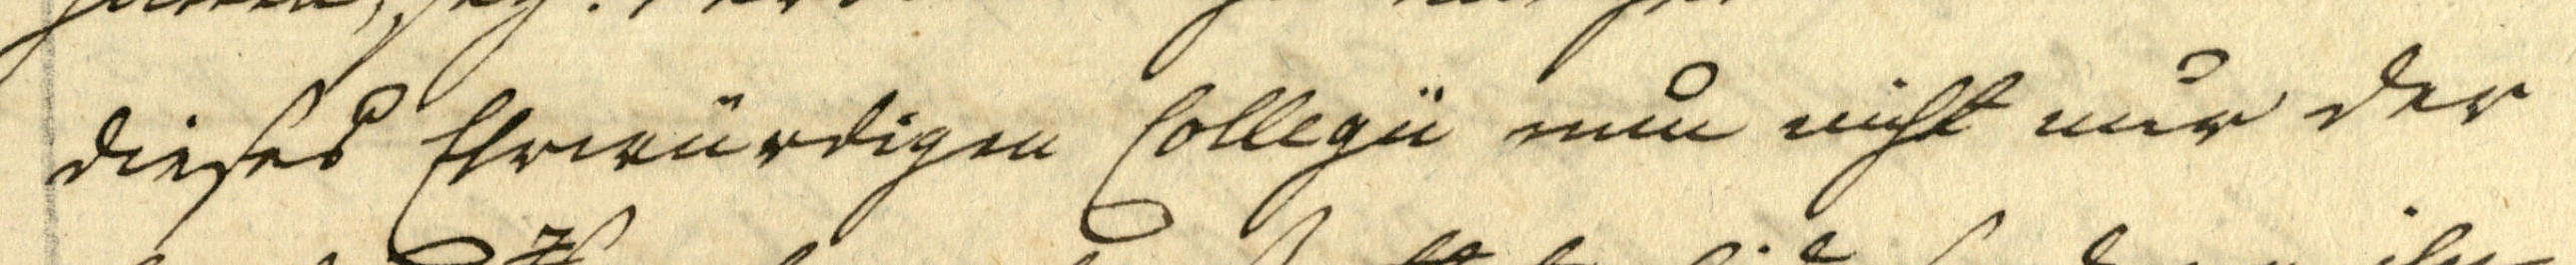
dieses Ehrwürdigen Collegii nun nicht nur der
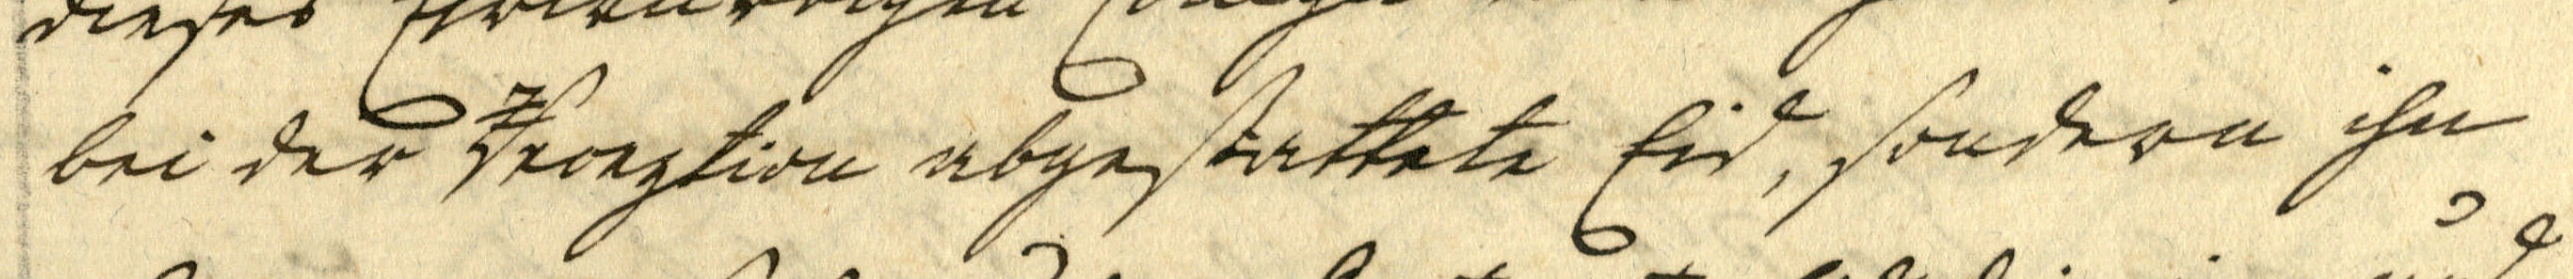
bei der Reception abgestattete Eid, sondern ihn
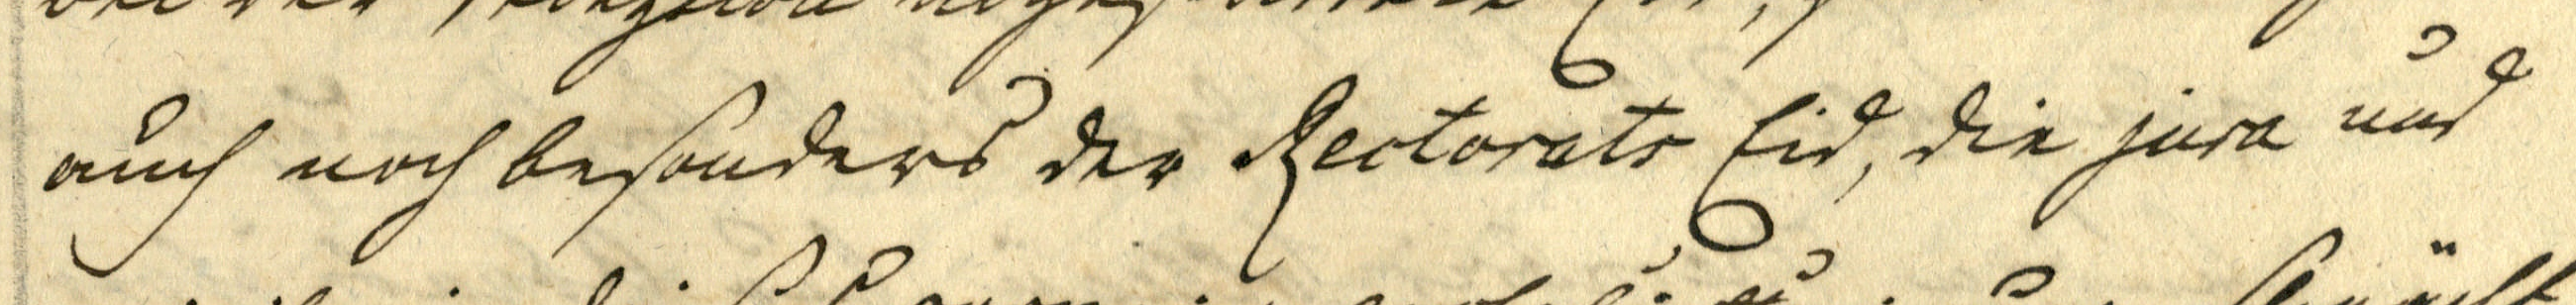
auch noch besonders der Rectorats Eid, die jura und
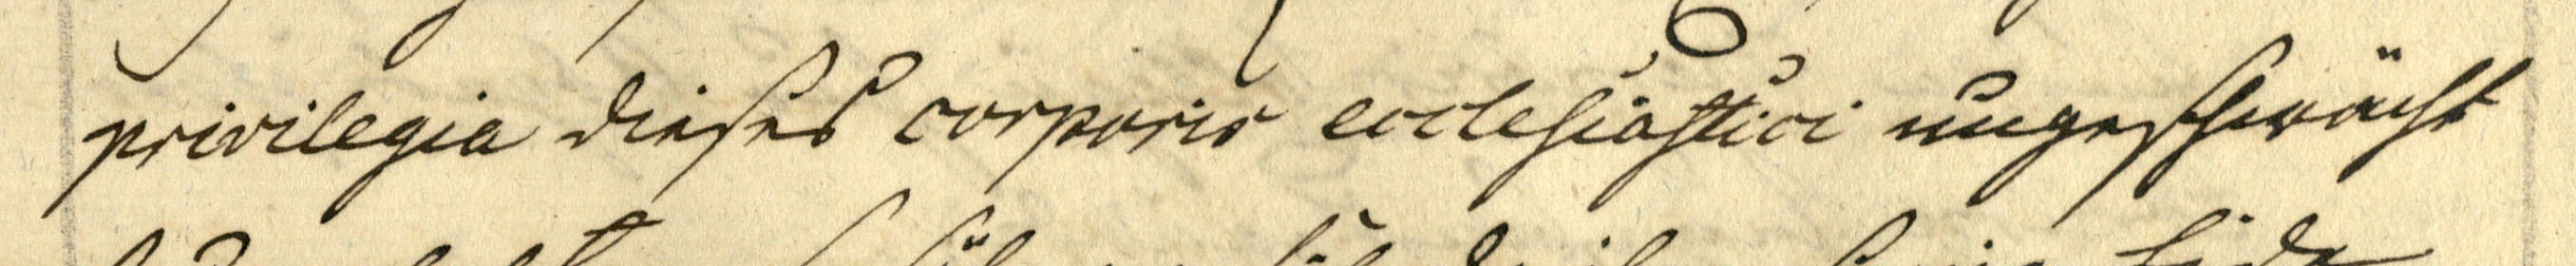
privilegia dieses corporis ecclesiastici ungeschwächt
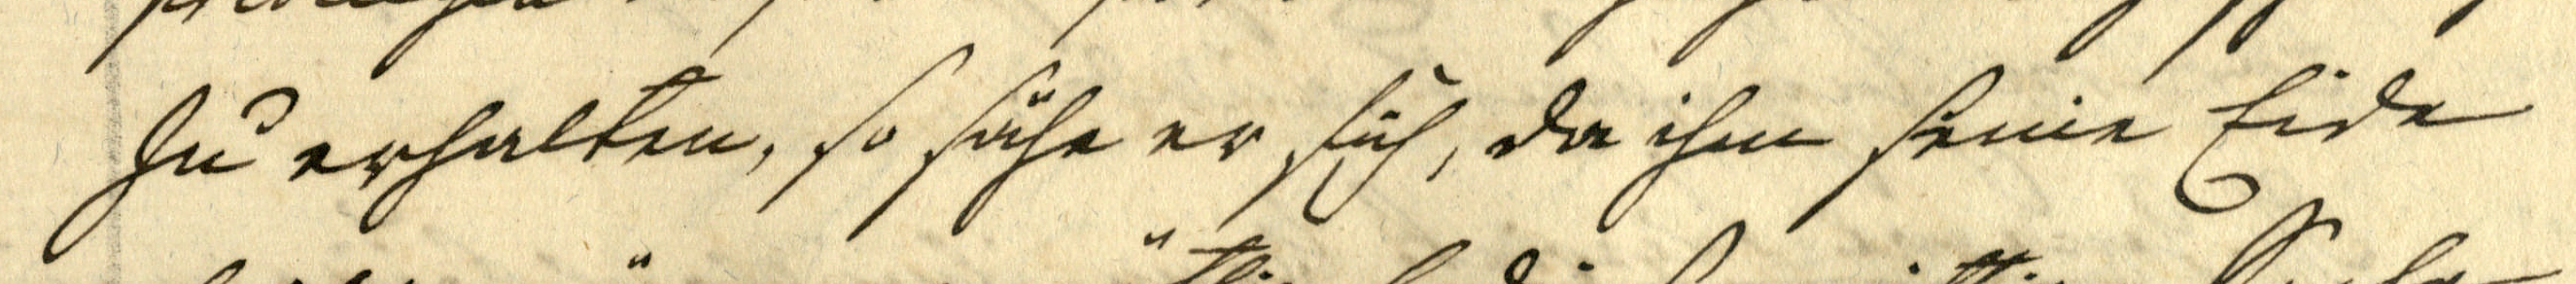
zu erhalten, so sähe er sich, da ihm seine Eide
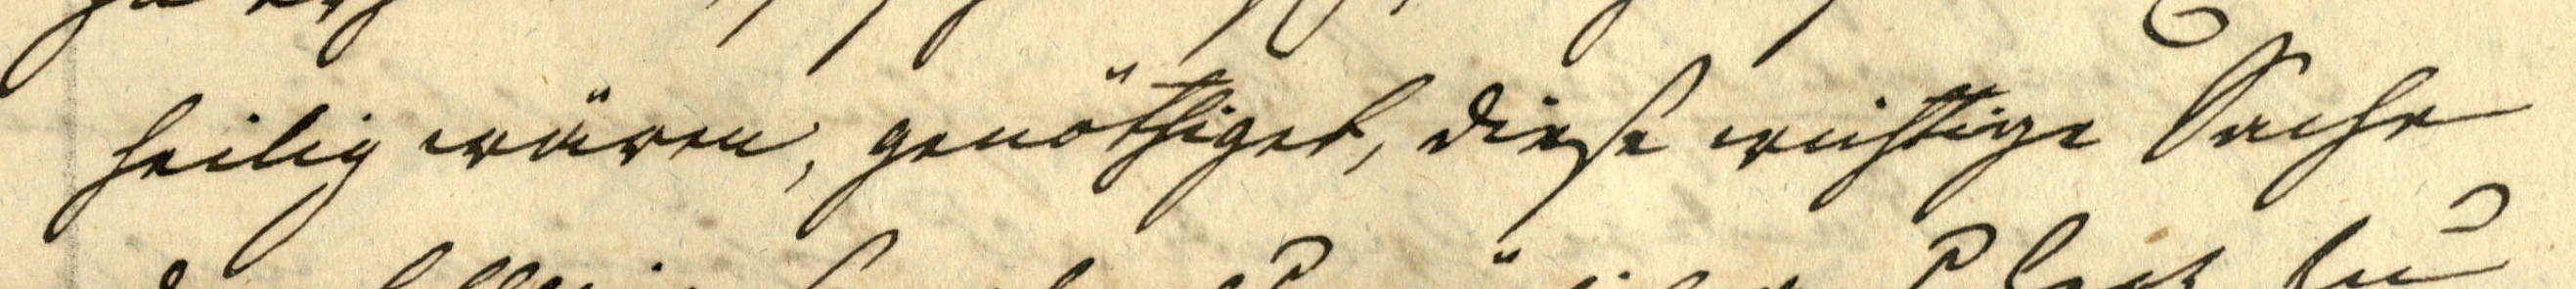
heilig wären, genöthiget, diese wichtige Sache
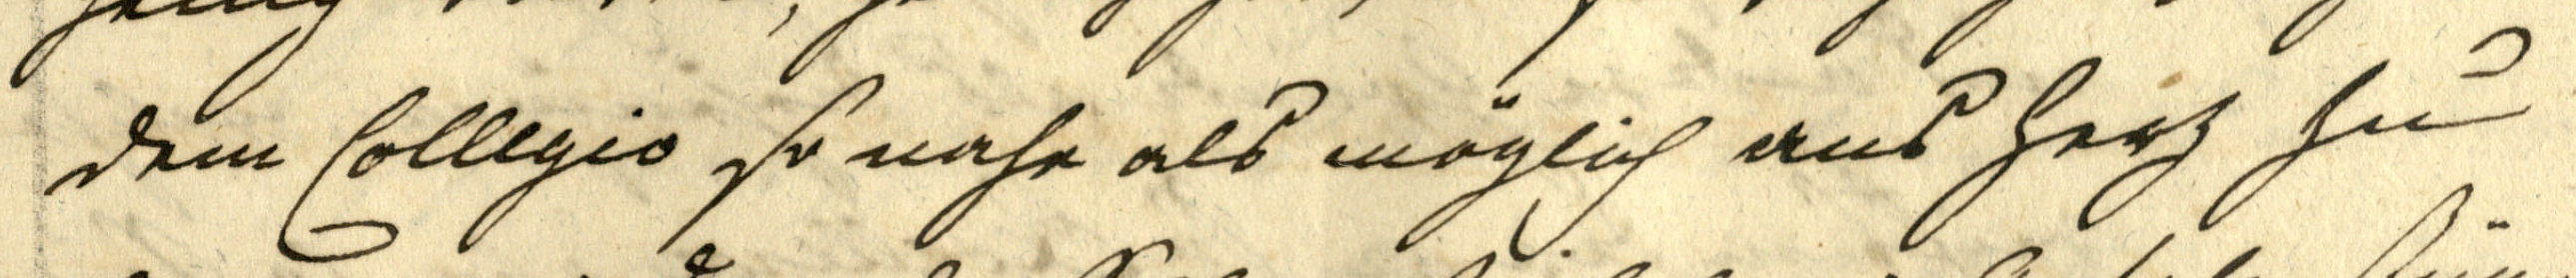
dem Collegio so nahe als möglich ans Herz zu
